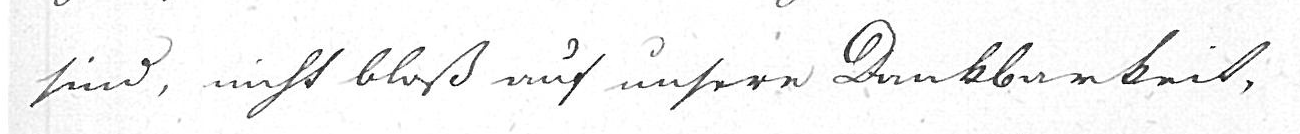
sind, nicht bloß auf unsere Dankbarkeit,
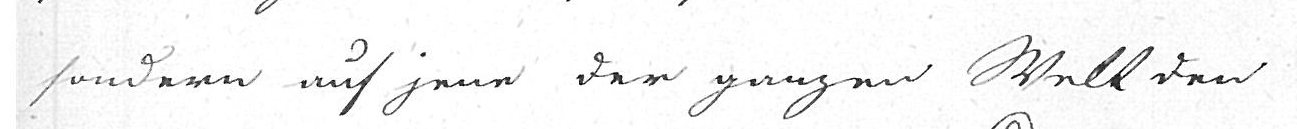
sondern auf jene der ganzen Welt den
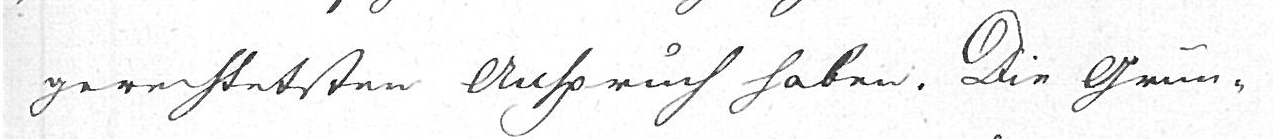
gerechtetsten Anspruch haben. Die Grün-
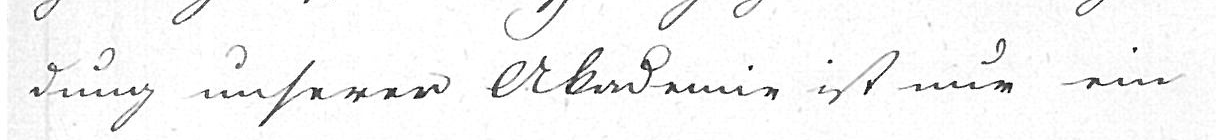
dund unserer Akademie ist nur ein
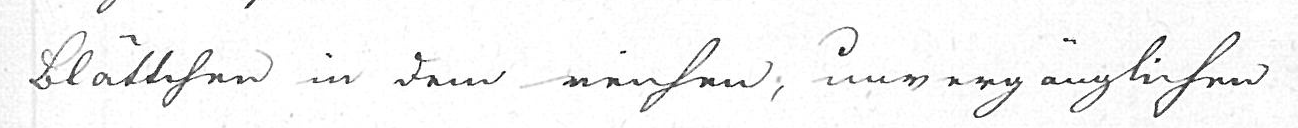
Blättchen in dem reichen, unvergänglichen
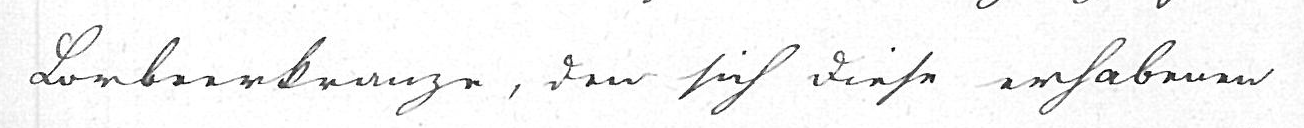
Lorbeerkranze, den sich diese erhabenen
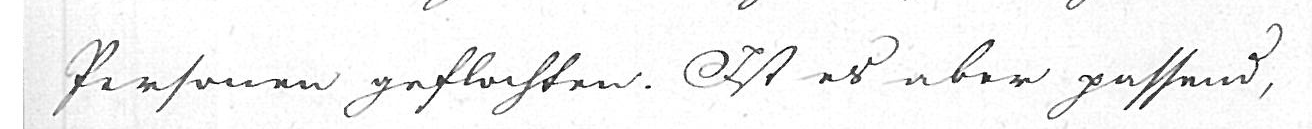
Personen geflochten. Ist es aber passend,
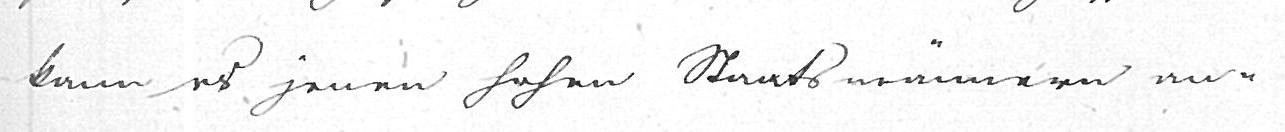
kann es jenen hohen Staatsmännern an-
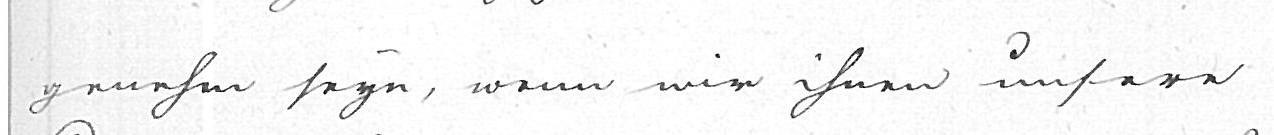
genehm seyn, wenn wir ihnen unsere
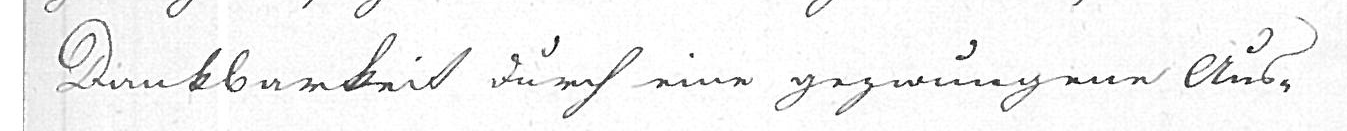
Dankbarkeit durch eine gezwungene Aus-
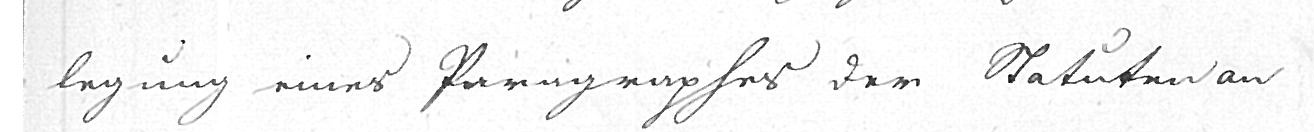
legung eines Paraphraphes der Statuten an
